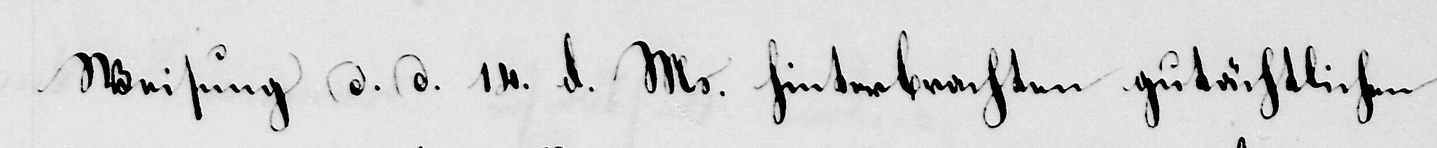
Weisung d. d. 14. d. Ms. hinterbrachten gutächtlichen
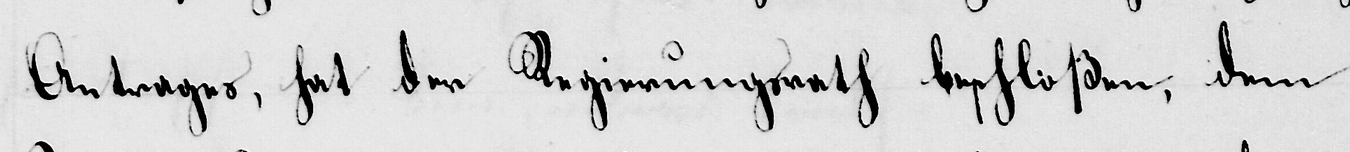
Antrages, hat der Regierungsrath beschloßen, dem
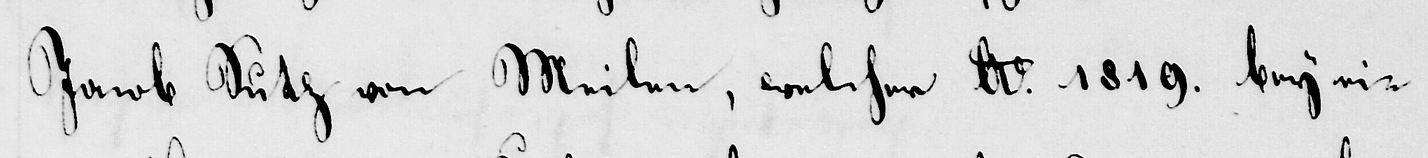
Jacob Sutz von Meilen, welcher A°. 1819. bey ei¬
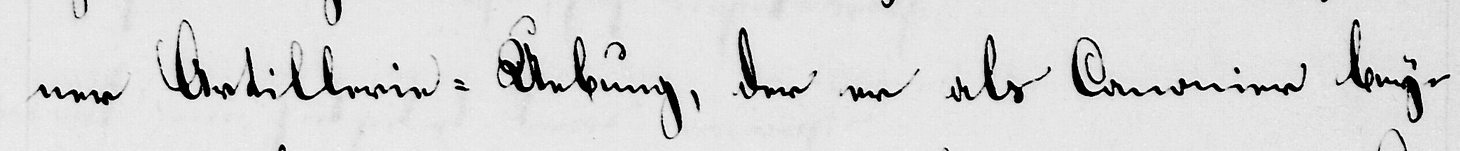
ner Artillerie-Uebung, der er als Canonier bey¬
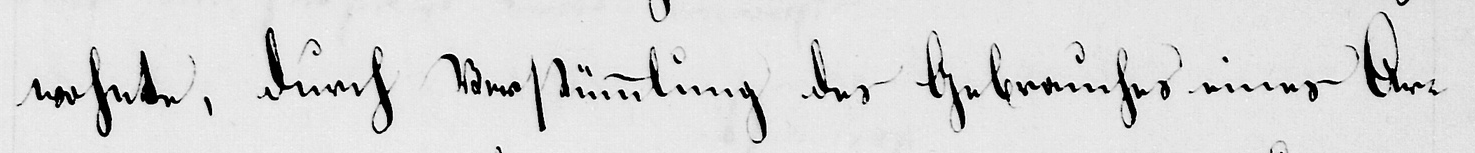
wohnte, durch Verstümmlung des Gebrauches eines Ar¬
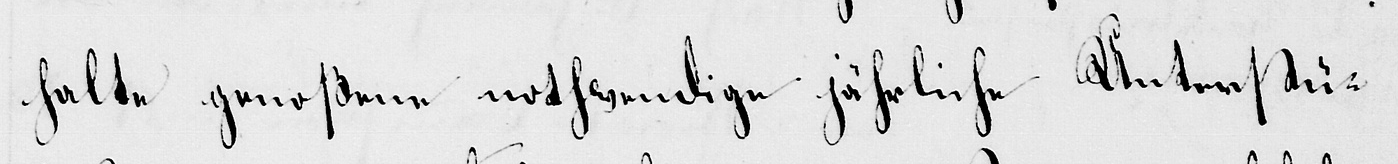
halte genoßene nothwendige jährliche Unterstü¬
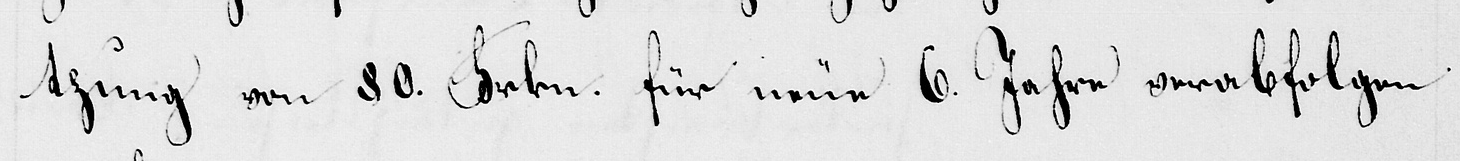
tzung von 80. Frkn. für neue 6. Jahre verabfolgen
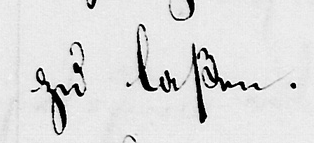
zu laßen.
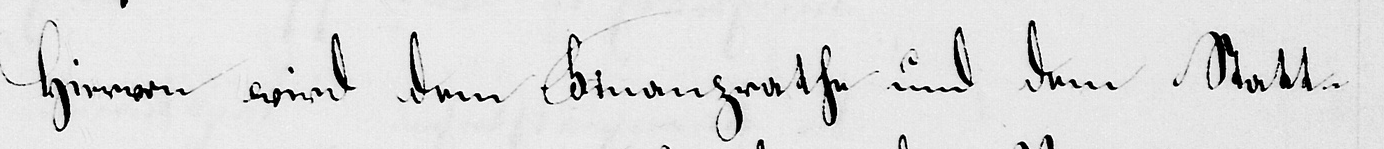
Hiervon wird dem Finanzrathe und dem Statt¬
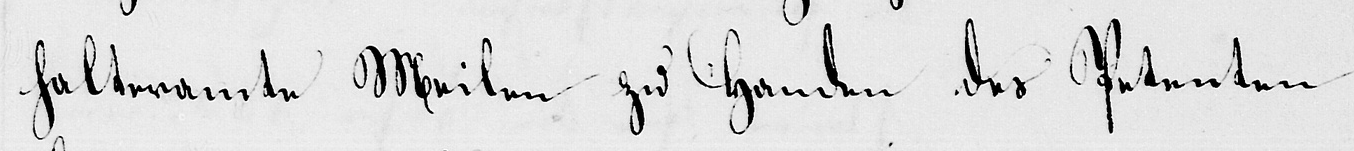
halteramte Meilen zu Handen des Petenten
